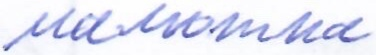малютка
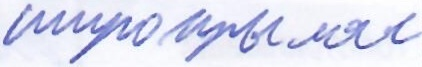широкрыляя
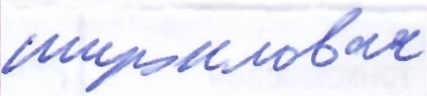широкловая
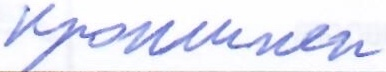кроншнеп
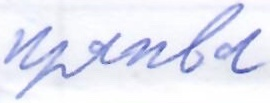кряпва
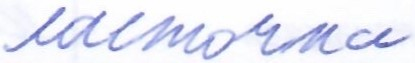ласточка
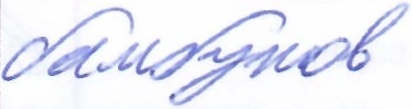бамбуков
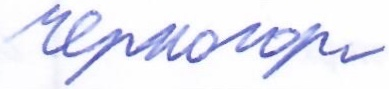черногорл
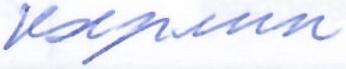карлип
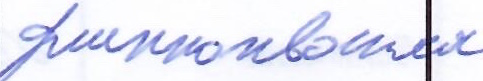длиннохвостяя
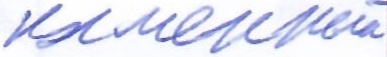каменный
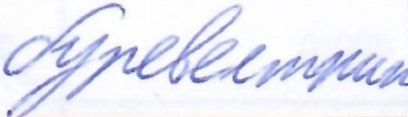буревестник
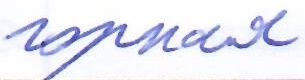горная
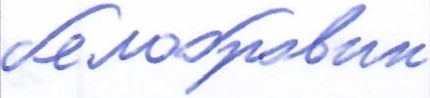белобровик
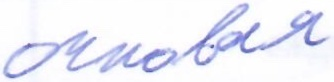очковая
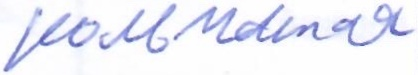кольчатая
